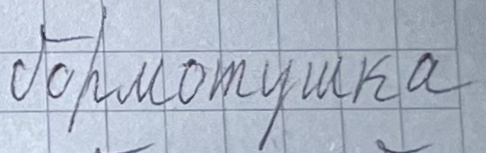бормотушка
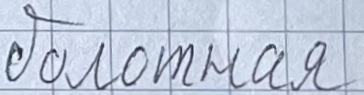болотная
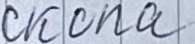скопа
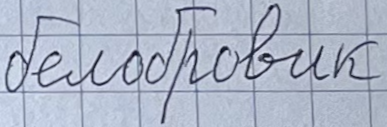белобровик
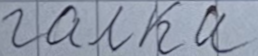галка
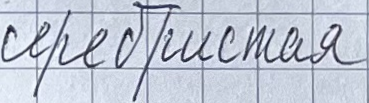серебристая
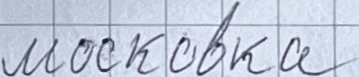московка
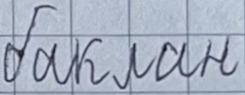баклан
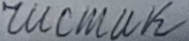чистик
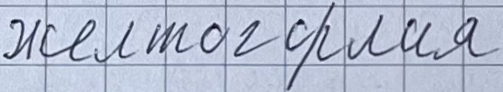желтогорлая
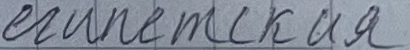египетская
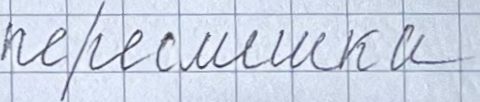пересмешка
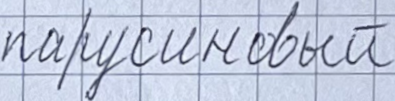парусиновый
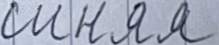синяя
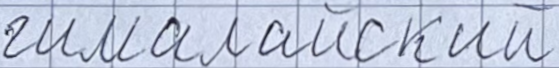гималайский
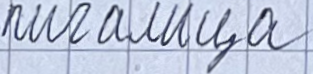пигалица
